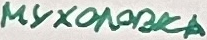мухоловка
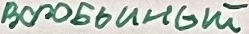воробьиный
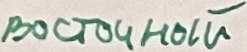восточный
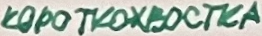короткохвостка
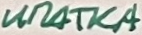ипатка
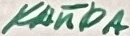кайра
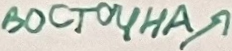восточная
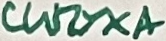сипуха
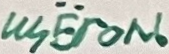щёголь
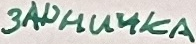зарничка
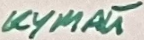кумай
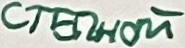степной
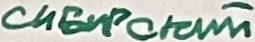сибирский
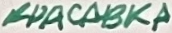красавка
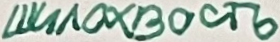шилохвость
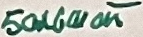большой
